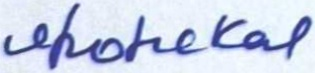яронская
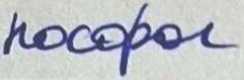носорог
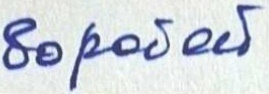воробей
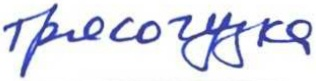трясогузка
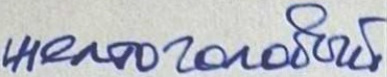желтоголовый
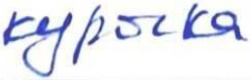курочка
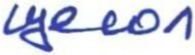щегол
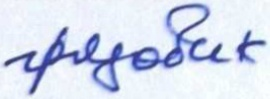грязовик
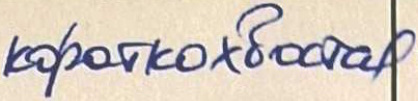короткохвостая
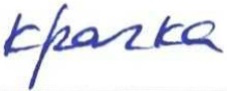крачка
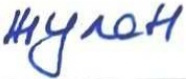жулон
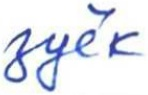зуёк
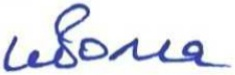иволга
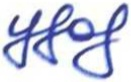удод
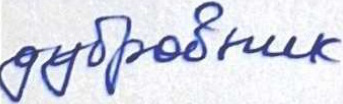дубровник
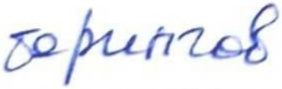берингов
